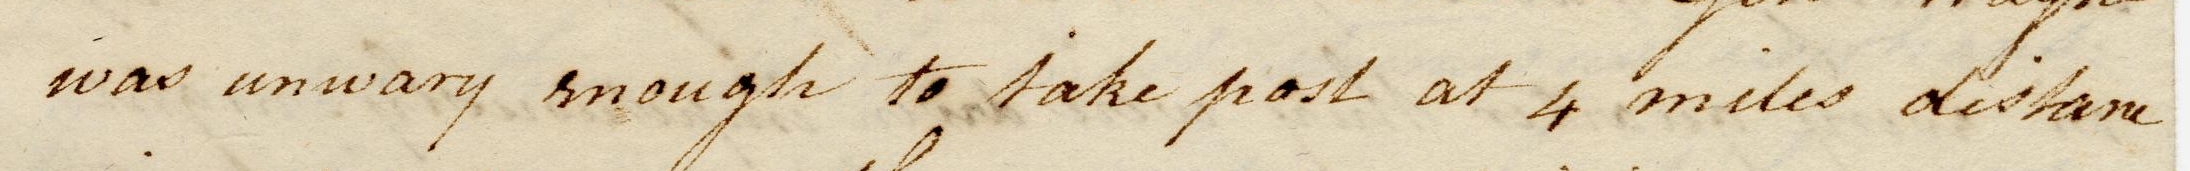was unwary enough to take post at 4 miles distanc
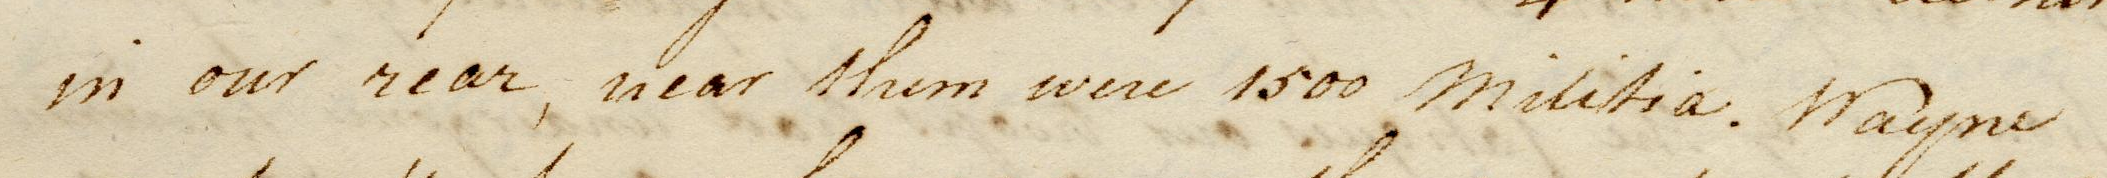in our rear, near them were 1500 Militia. Wayne
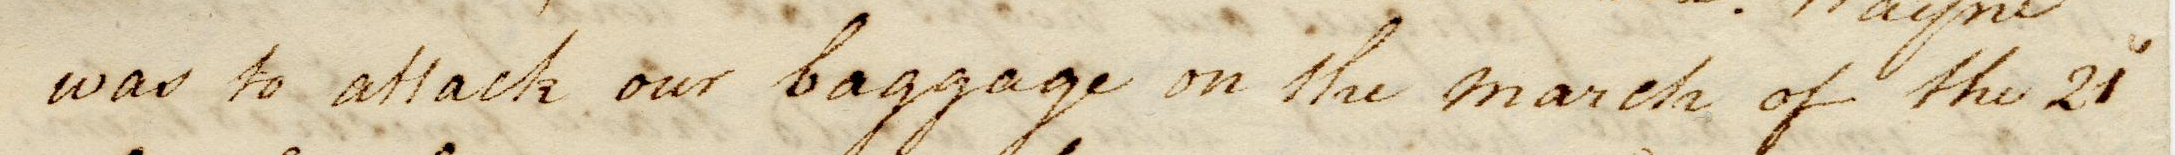was to attack our baggage on the march of the 21^t
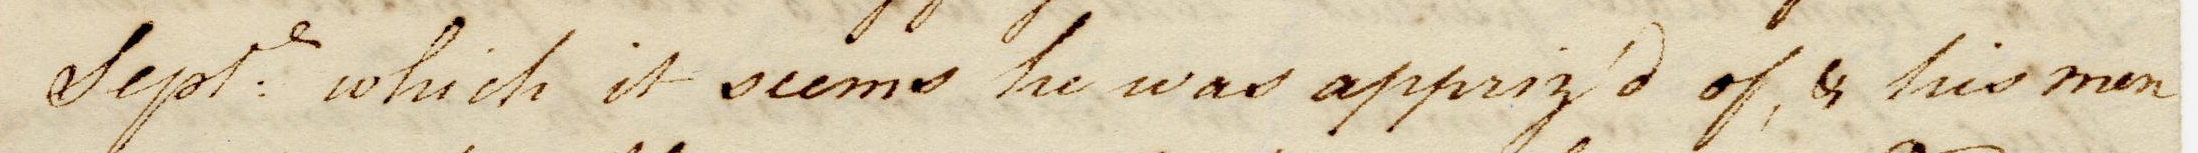Sept^r: which it seems he was appriz'd of & his men
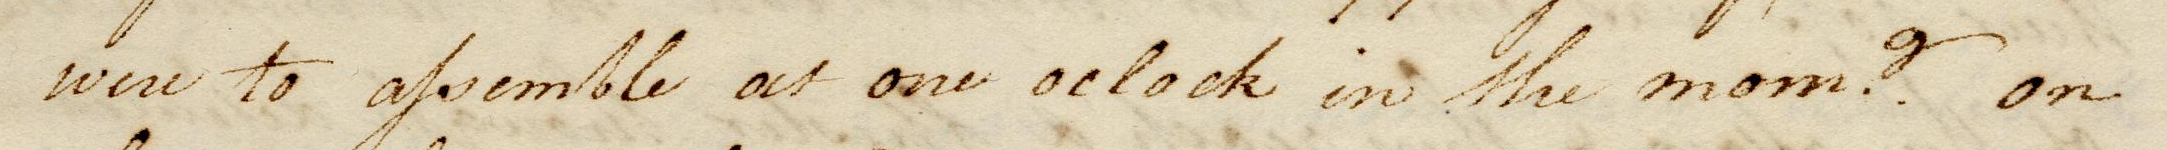were to assemble out one oclock in the morn^g. On
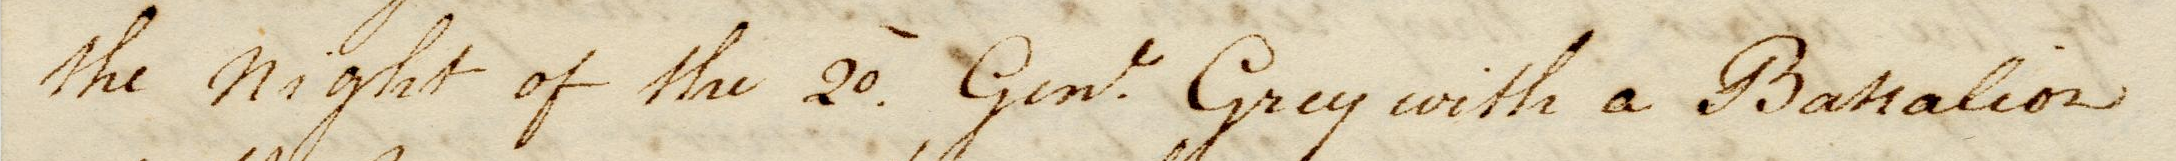the night of the 20. Gen^l. Grey with a Battalion
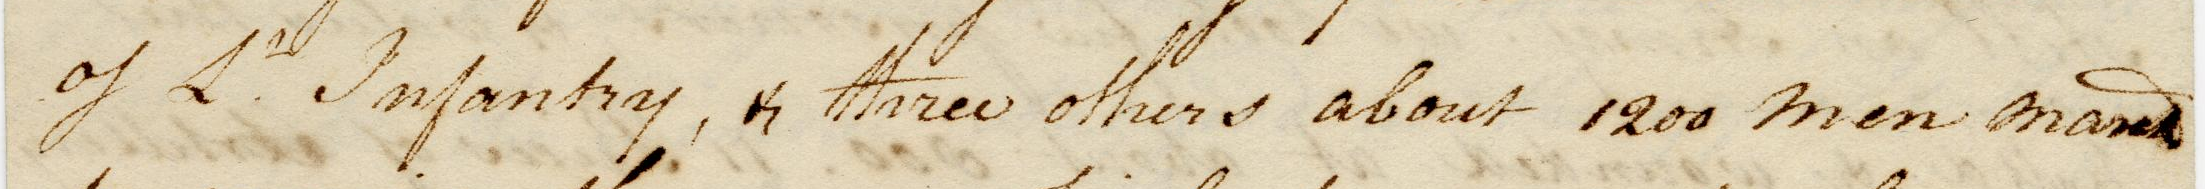of L^t. Infantry, & three others about 1200 Men marchd
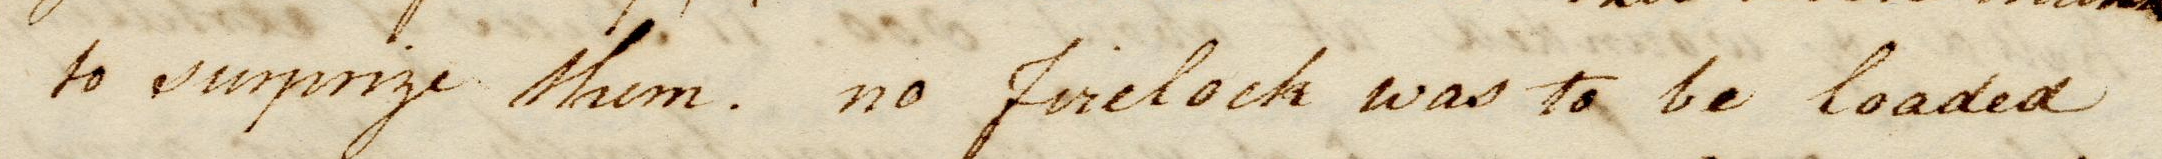to surprize them. no firelock was to be loaded
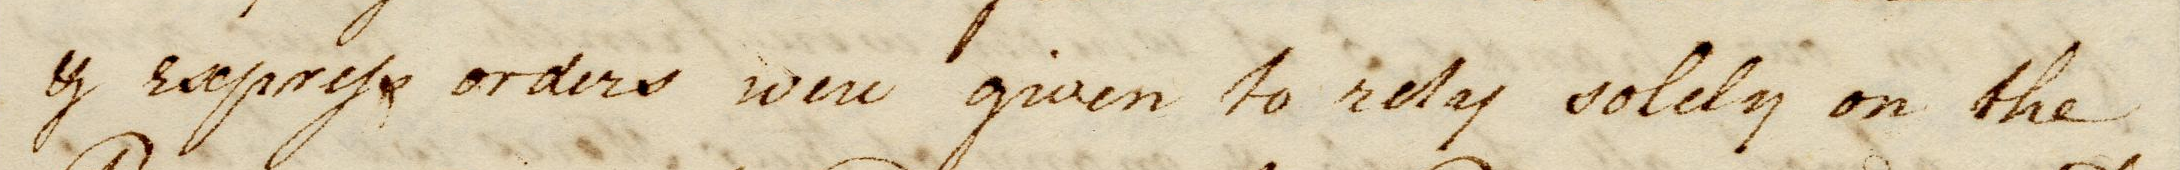& express orders were given to rely solely on the
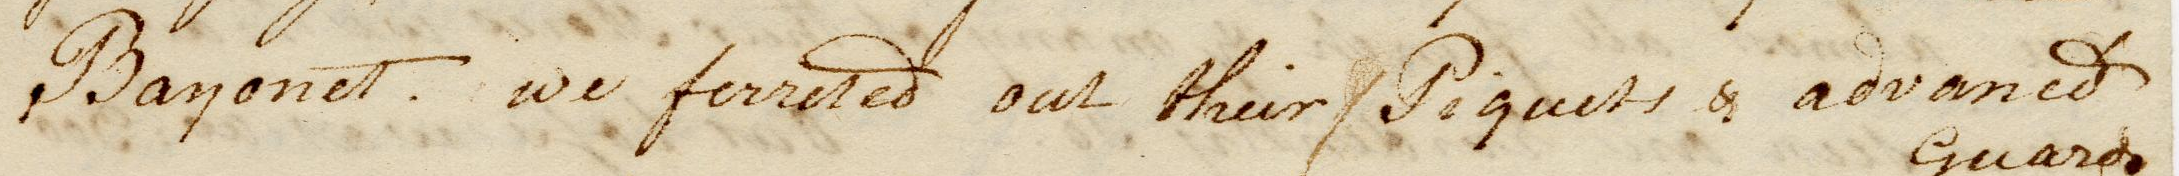Bayonet. we ferreted out their Piquets & advaned
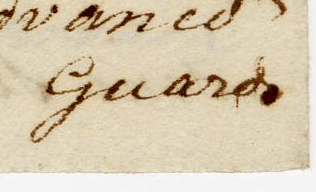Guards
